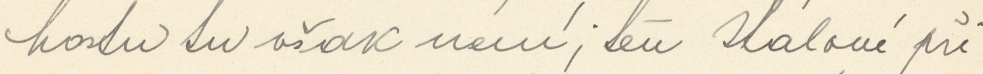Mostu tu však není, ten Italové při
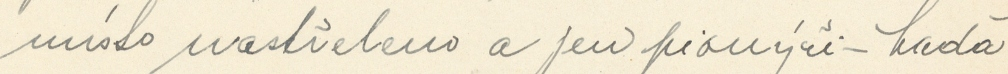místo nastřeleno a jen pionýři - Maďa-
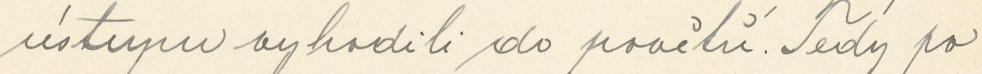ústupu vyhodili do povětří. Tedy po
